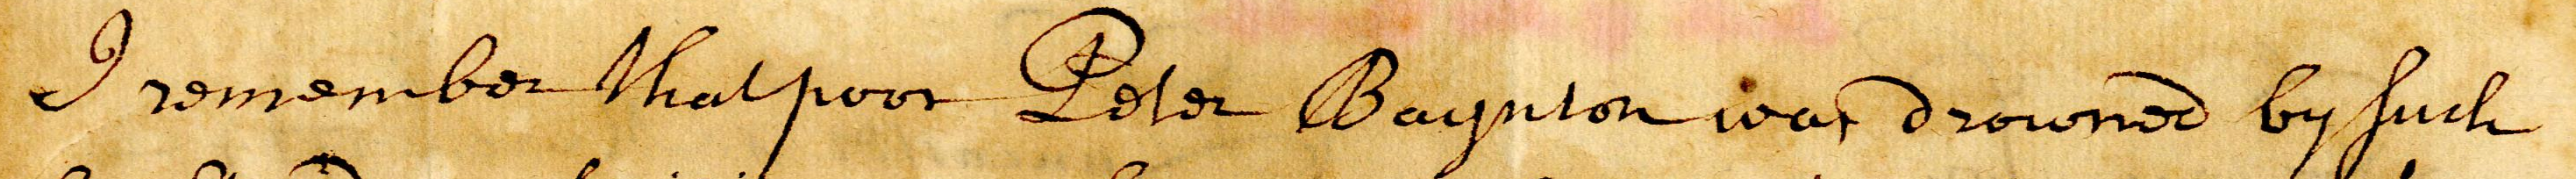I remember that poor Peter Baynton was drowned by such
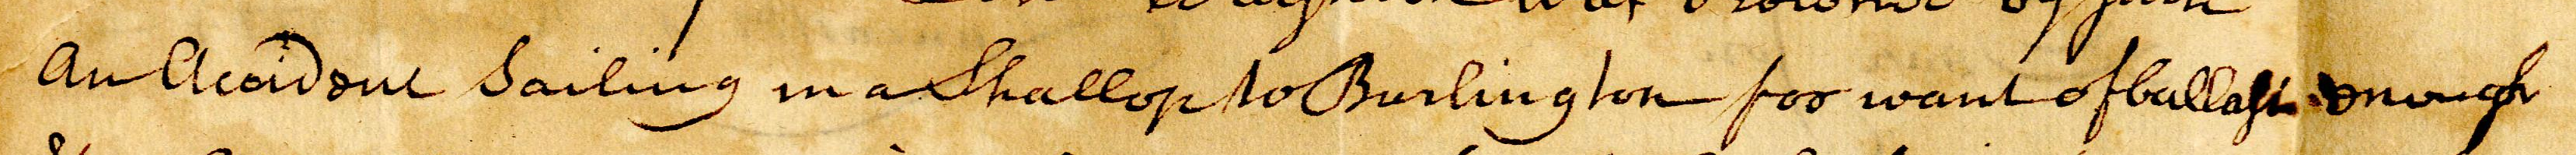An Accident Sailing in a Shallop to Burlington for want of ballast enough
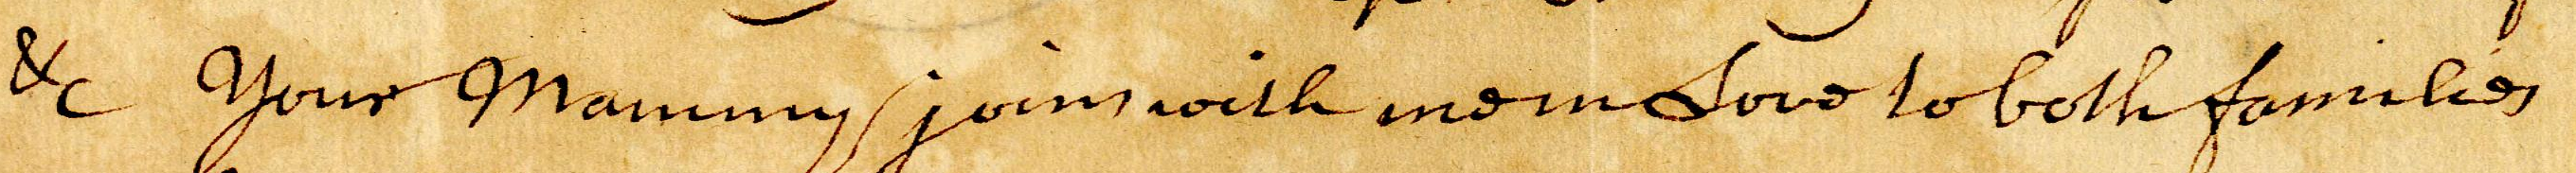&c Your Mammy joins with me in Love to both families
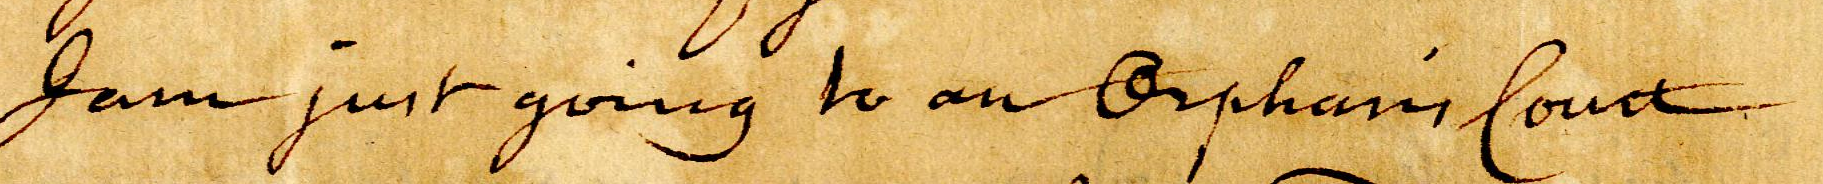I am just going to an Orphan's Court
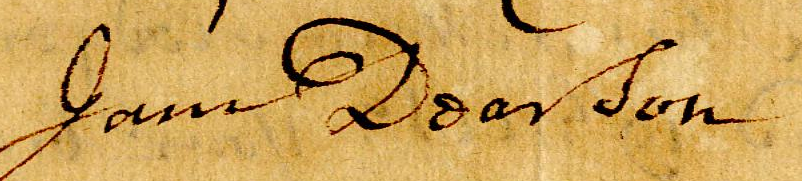I am Dear Son
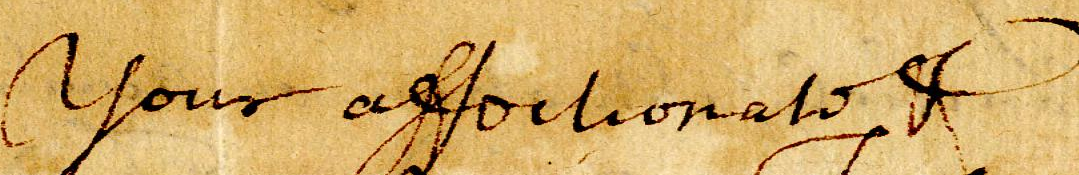Your affectionate &
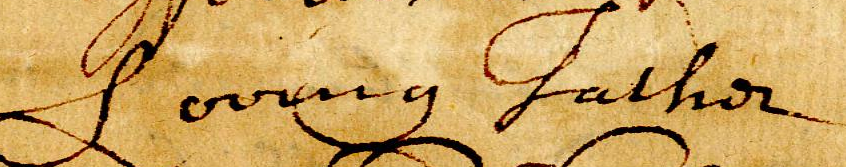Loving Father
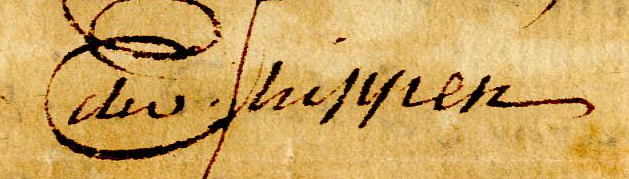Edw. Shippen
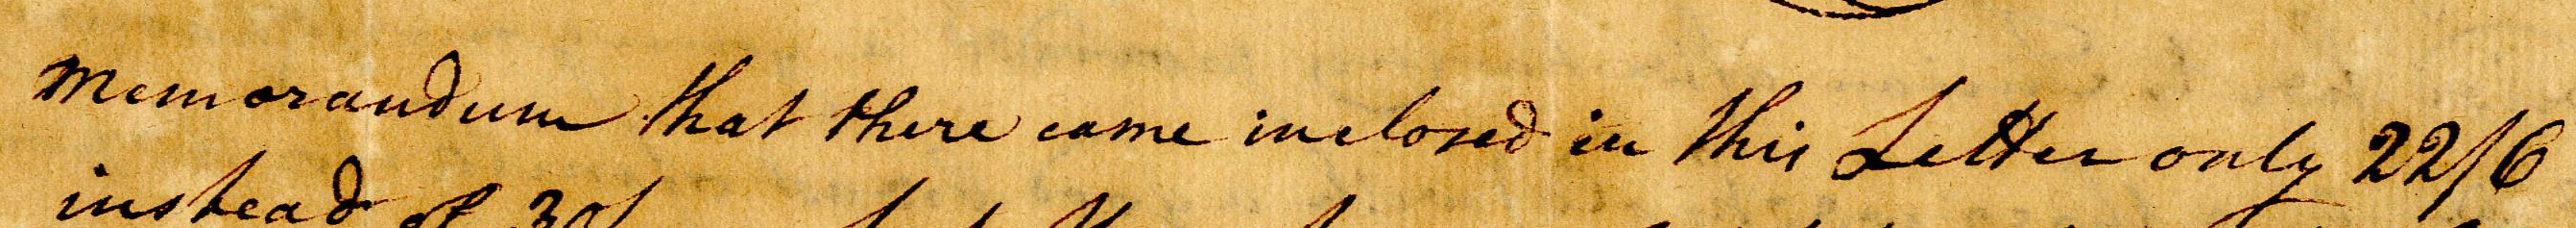Memorandum that there came inclosed in this Letter only 22s6
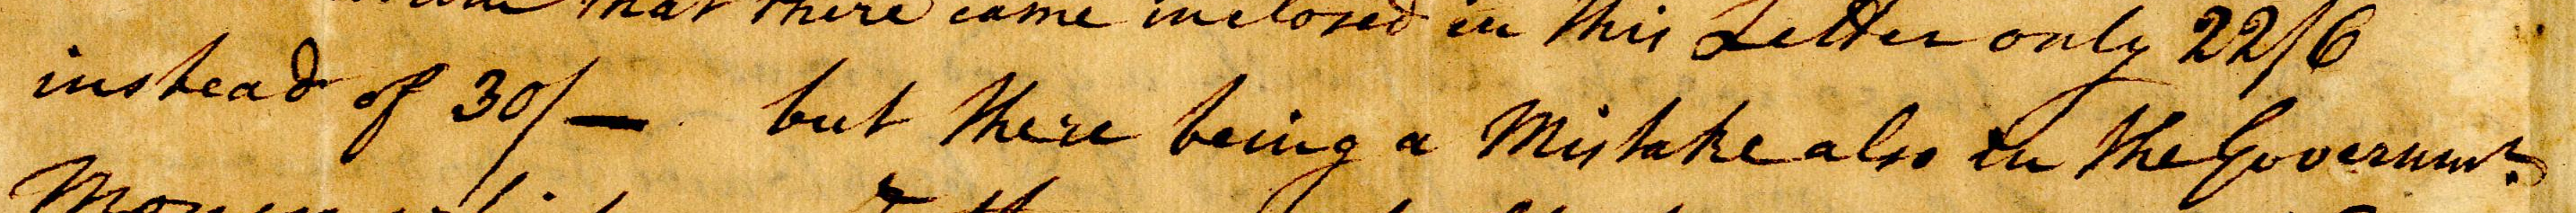instead of 30s- but there being a Mistake also in the Goverments
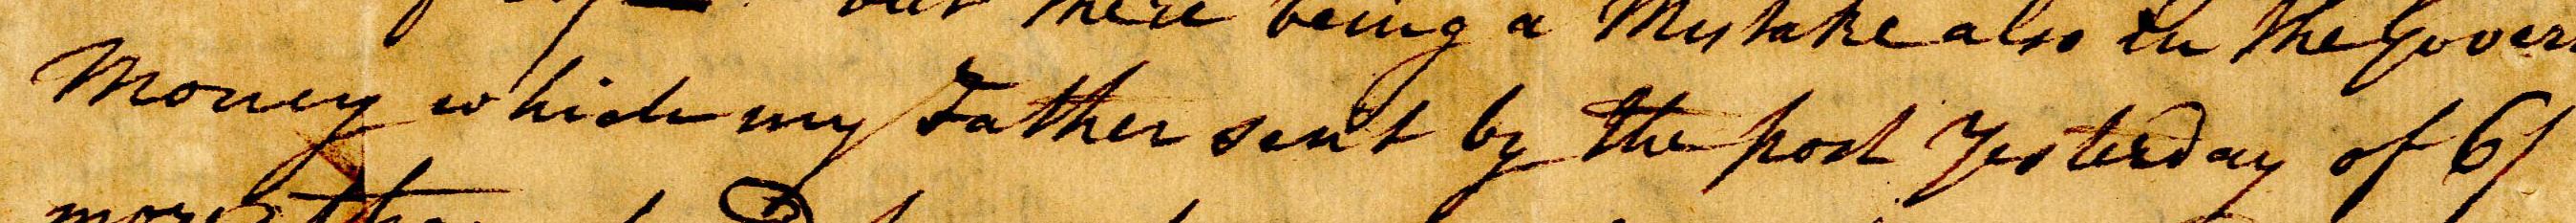Money which my Father sent by the post Yesterday of 6s
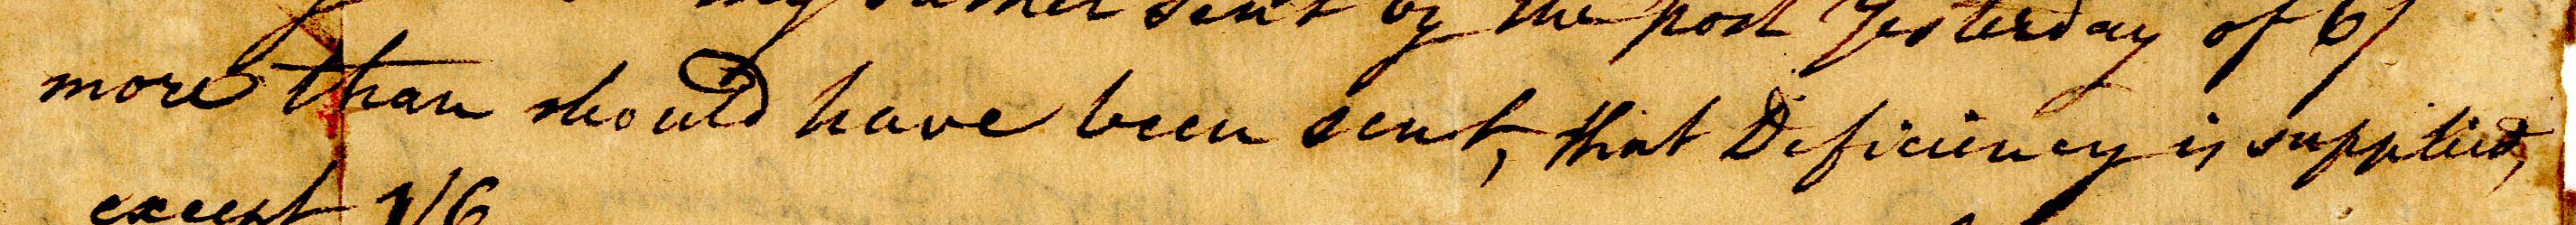more than should have been sent, that Dificiency is supplied,
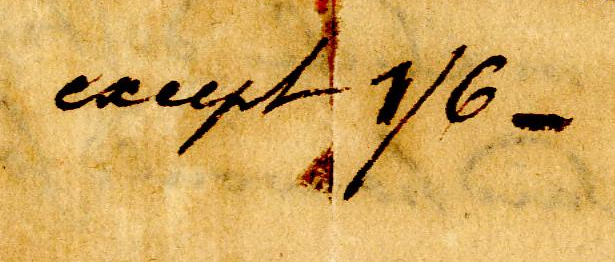except 1s6-
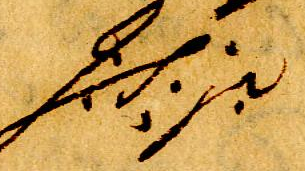J.S. jr.
